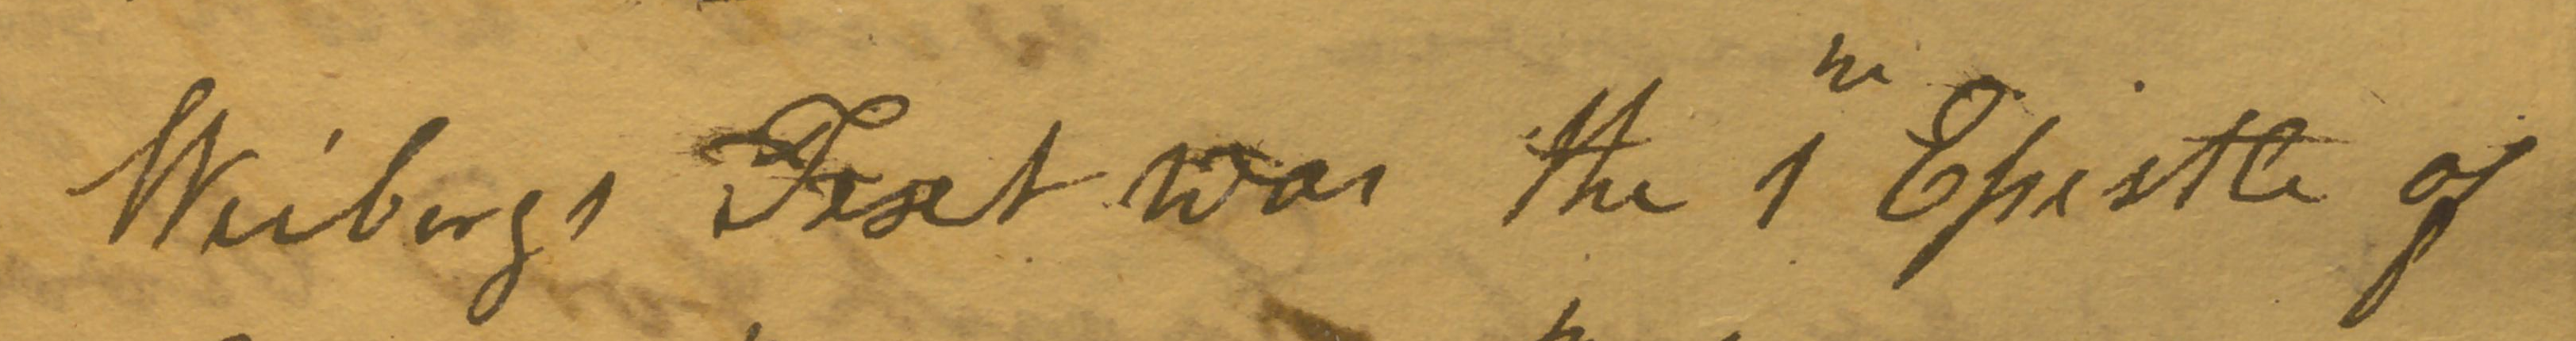Weibergs Text was the 1^th Epistle of
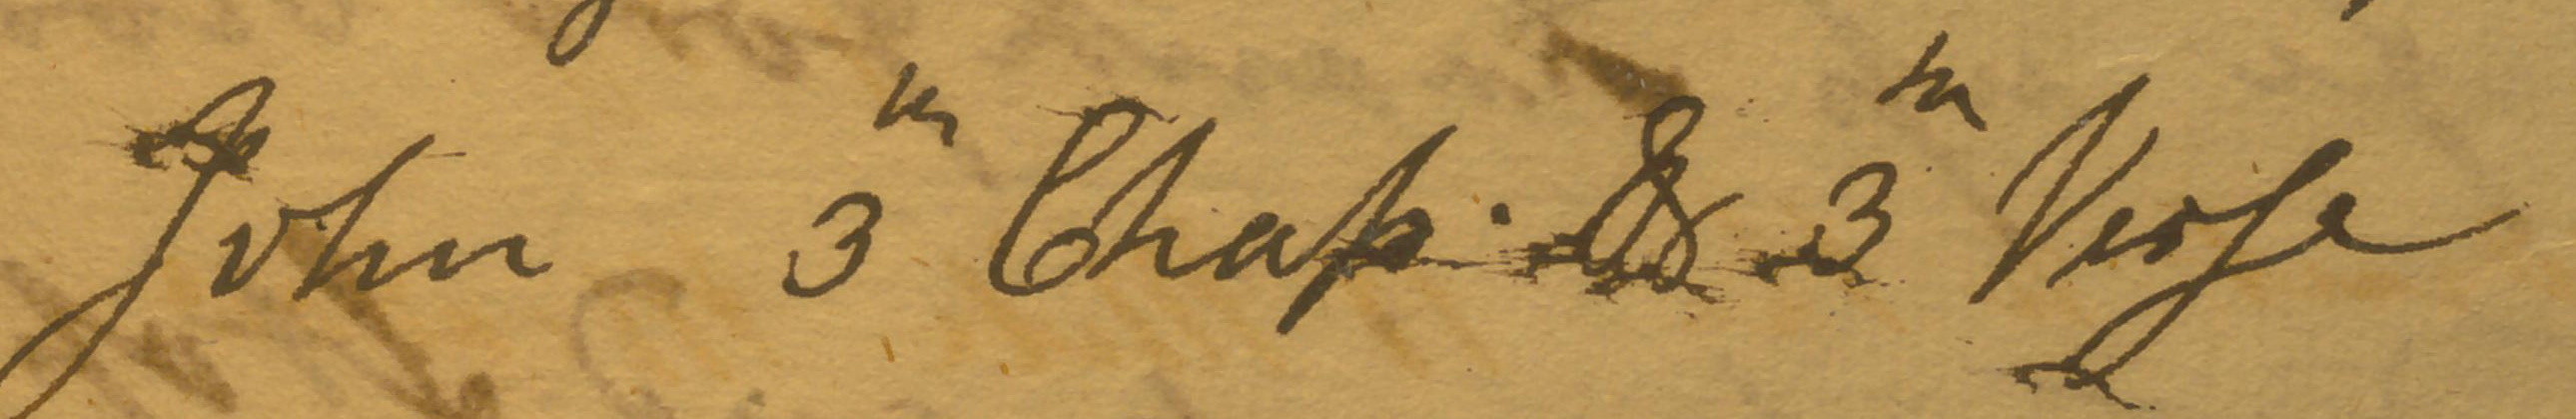John 3^th Chap. & 3^th Verse
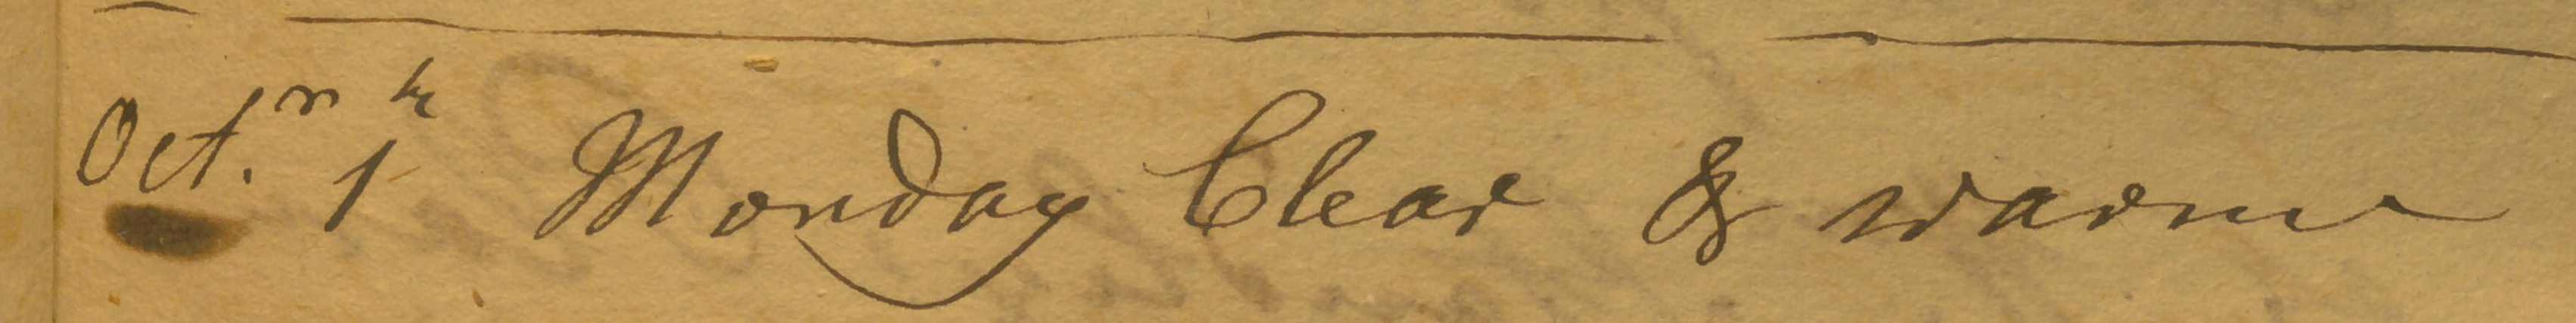Oct^r. 1^th Monday Clear & warme
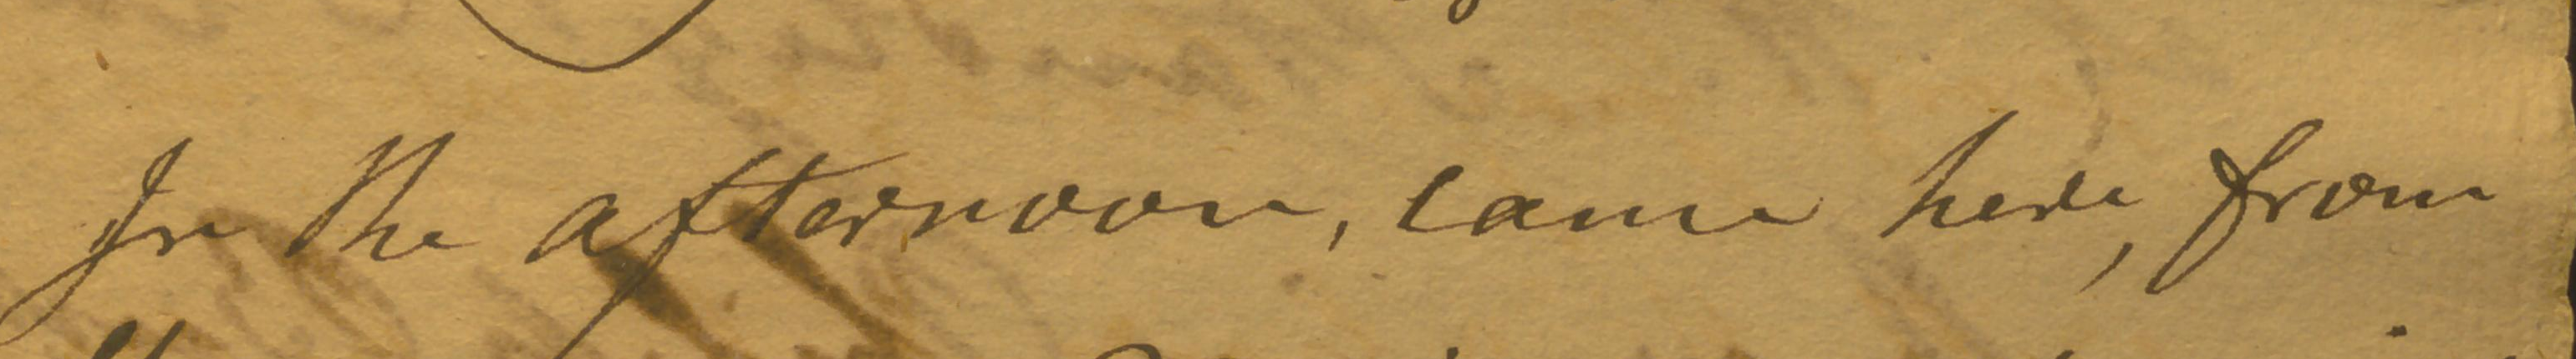In the afternoon, came here from
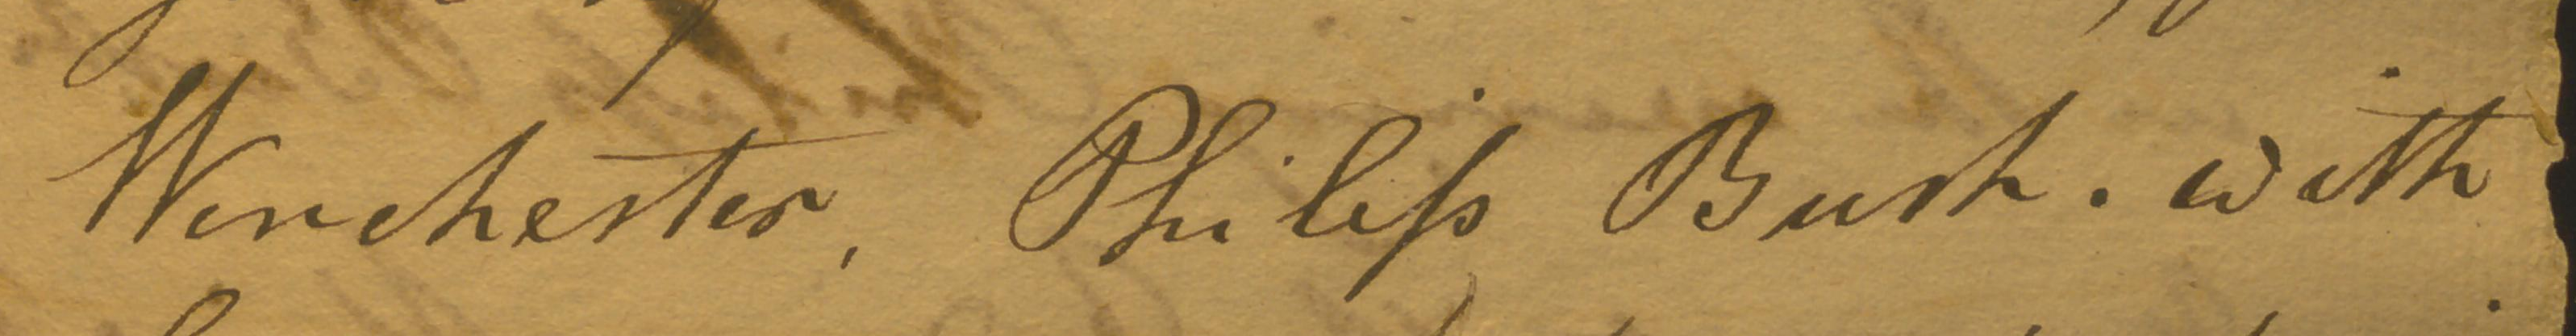Wenchester Philip Bush. with
